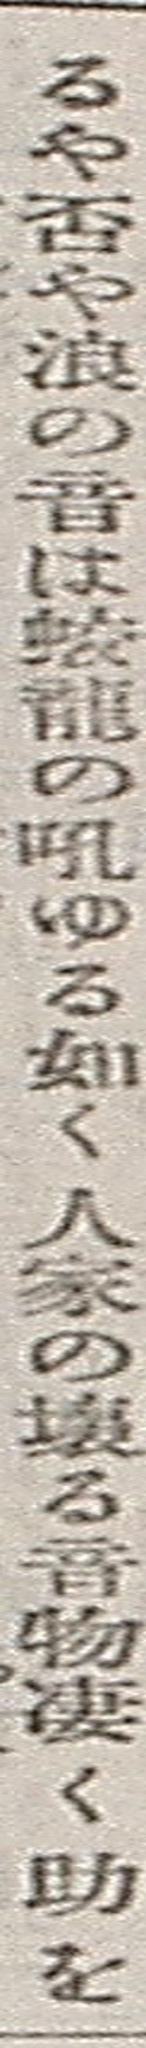るや否や浪の音は蛟龍の吼ゆる如く人家の壊る音物凄く助を
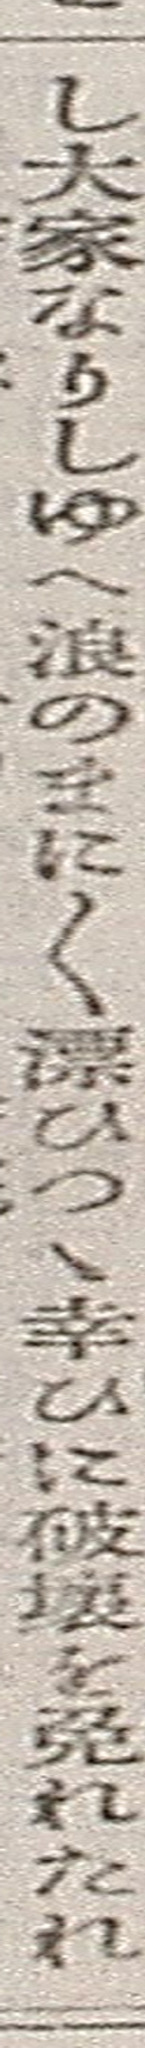し大家なりしゆへ浪のまに〳〵漂ひつゝ幸ひに破壊を免れたれ
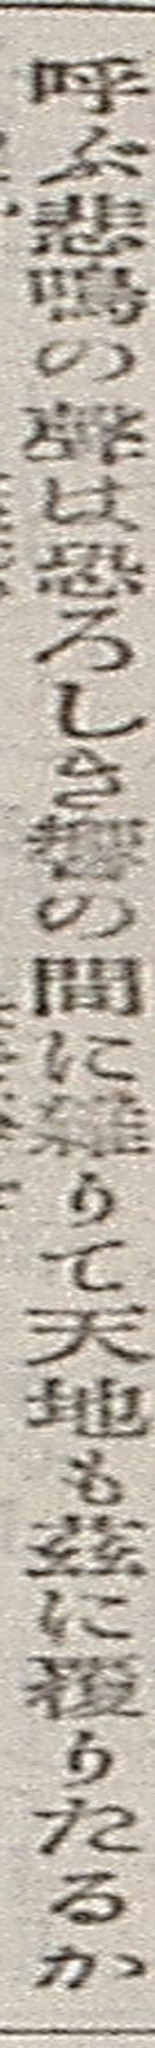呼ぶ悲鳴の声は恐ろしき響の間に雑りて天地も茲に覆りたるか
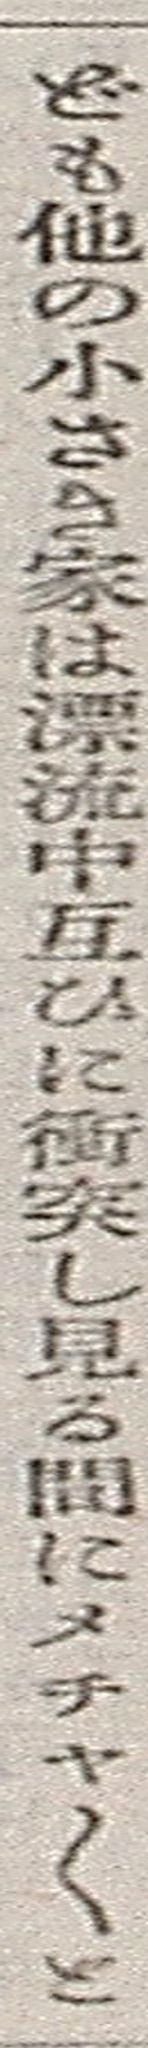ども他の小さき家は漂流中互ひに衝突し見る間にメチャ〳〵と
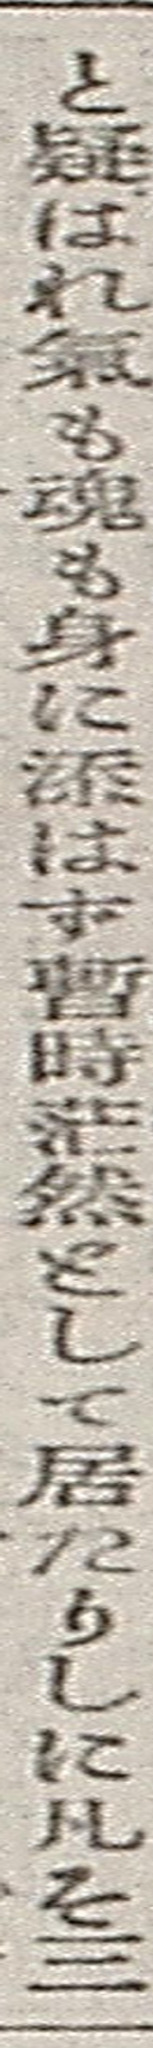と疑はれ気も魂も身に添はず暫時茫然として居たりしに凡そ三
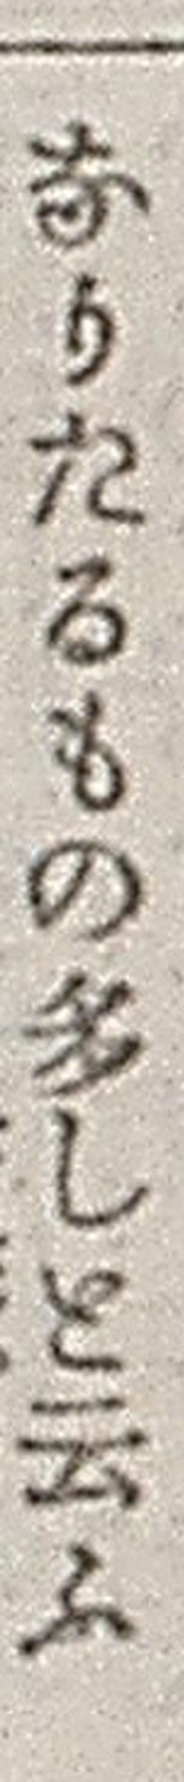なりたるもの多しと云ふ
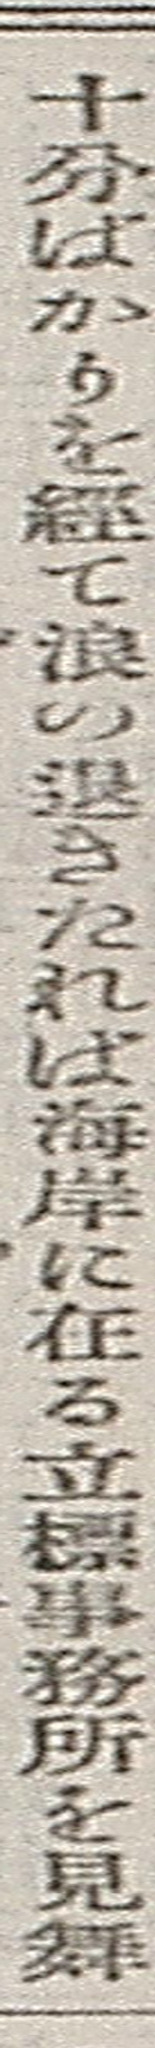十分ばかりを経て浪の退きたれば海岸に在る立標事務所を見舞
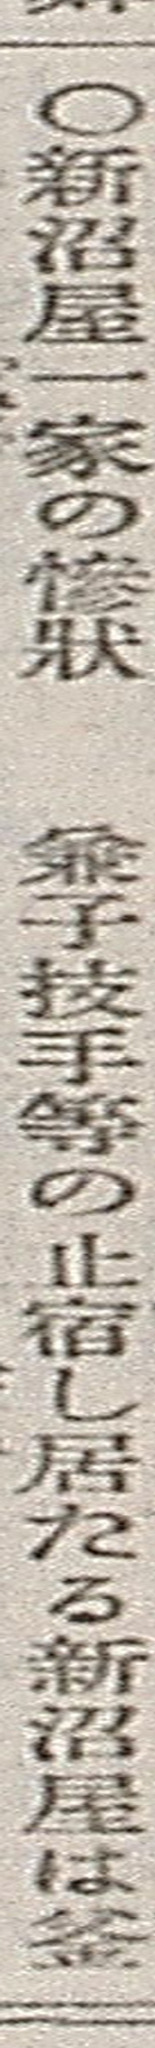○新沼屋一家の惨状兼子技手等の止宿し居たる新沼屋は釜
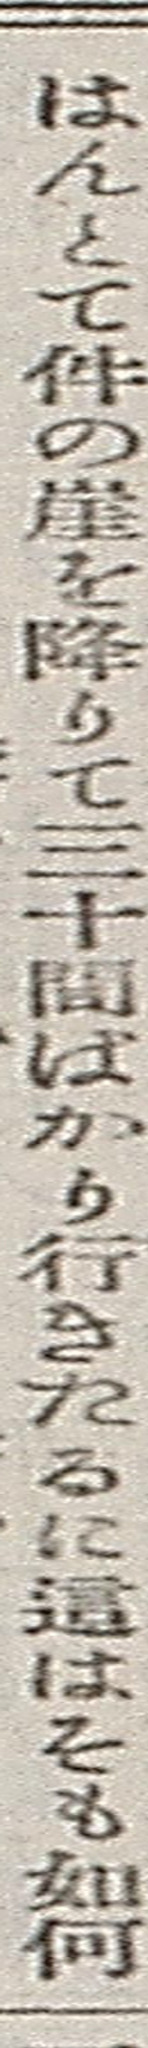はんとて件の崖を降りて三十間ばかり行きたるに這はそも如何
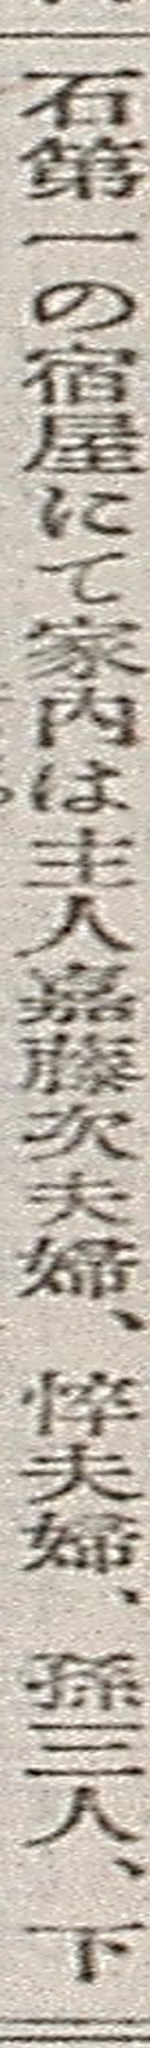石第一の宿屋にて家内は主人嘉藤次夫婦、悴夫婦、孫三人、下
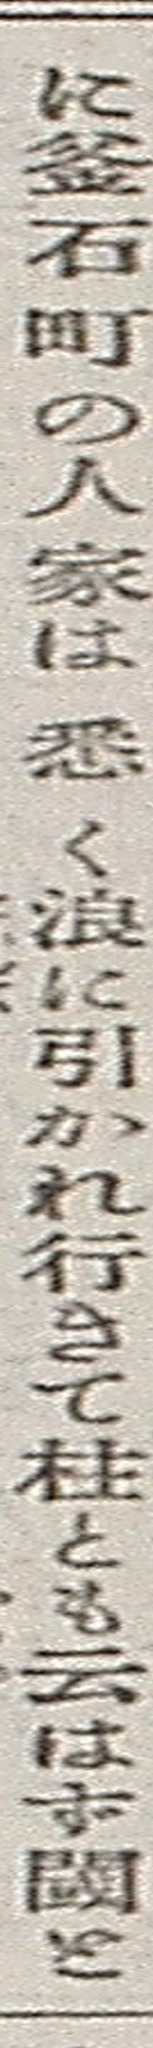に釜石町の人家は悉く浪に引かれ行きて柱とも云はず閾と
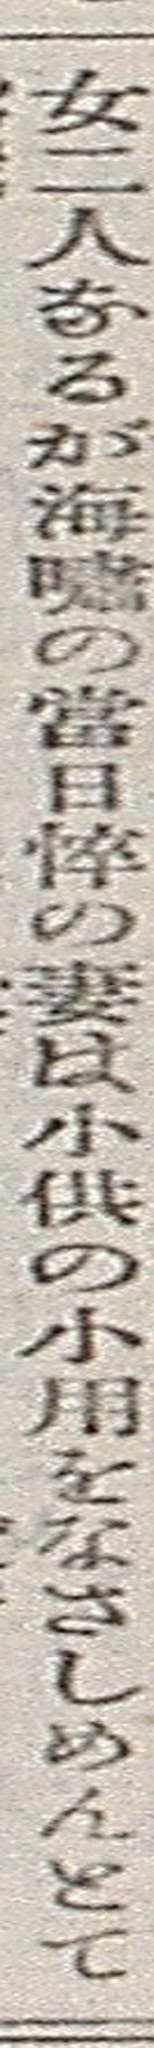女二人なるが海嘯の当日悴の妻は小供の小用をなさしめんとて
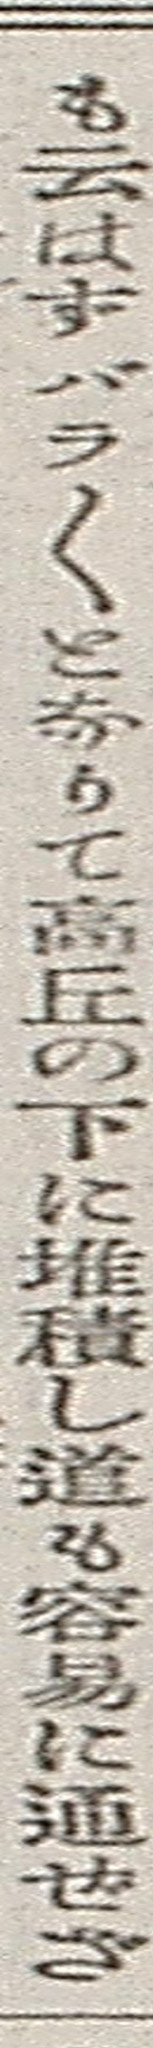も云はずバラ〳〵となりて高丘の下に堆積し道も容易に通ぜざ
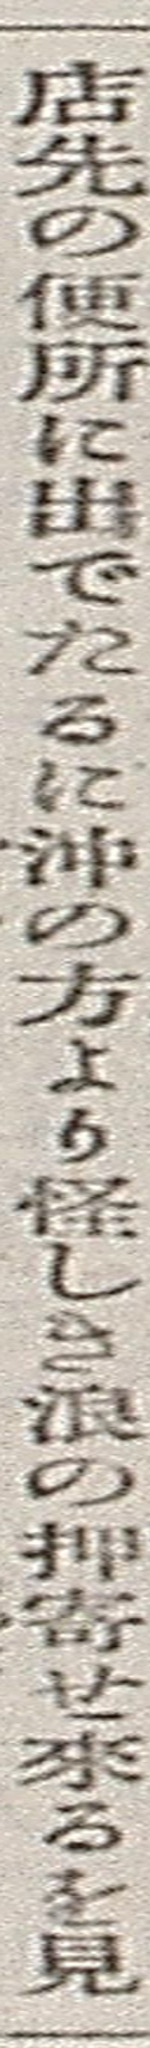店先の便所に出でたるに沖の方より怪しき浪の押寄せ来るを見
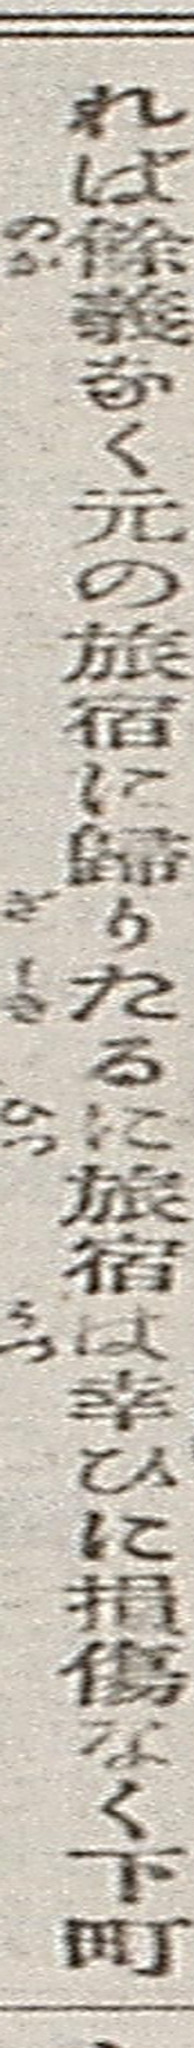れば余義なく元の旅宿に帰りたるに旅宿は幸ひに損傷なく下町
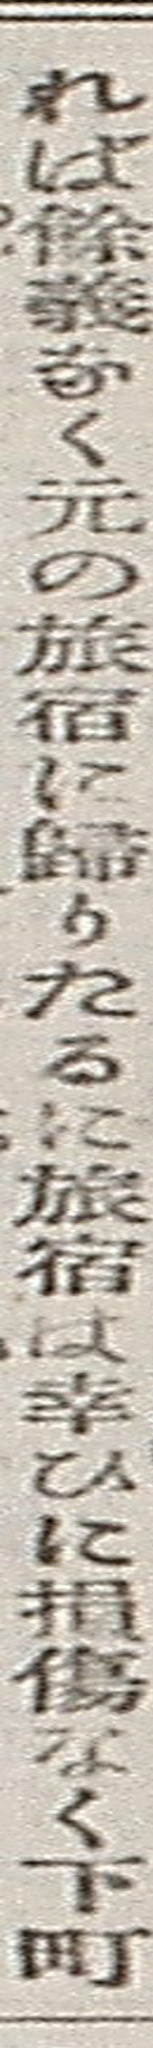れば余義なく元の旅宿に帰りたるに旅宿は幸ひに損傷なく下町
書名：風俗畫報臨時増刊第百二十號　大海嘯被害録（下）
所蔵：東京大学地震研究所図書室 Earthquake Research Institute Library, The University of Tokyo, JAPAN
